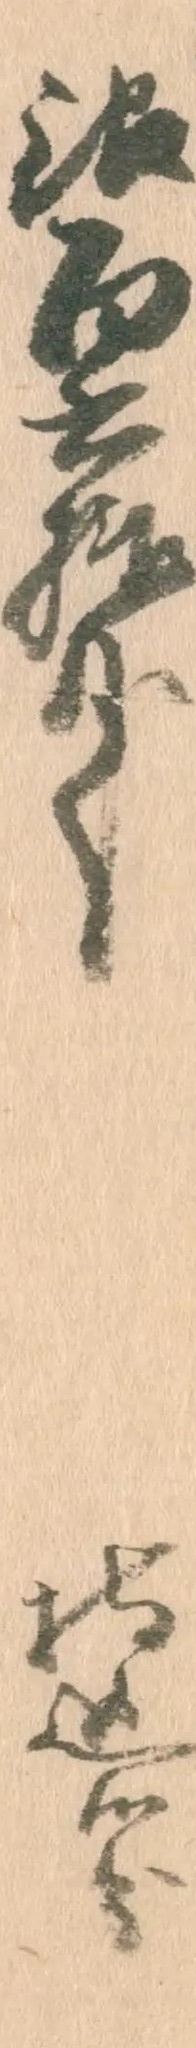銀百六拾匁持込候分
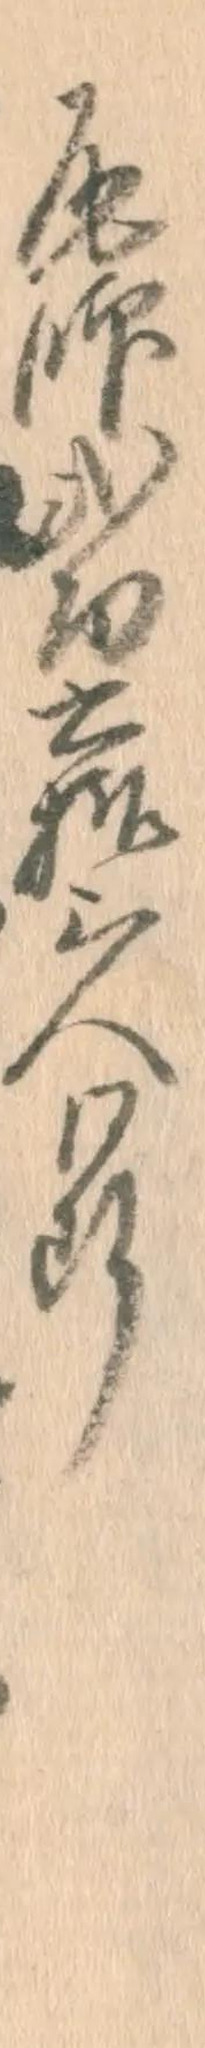瓦師弐百六拾三人同断
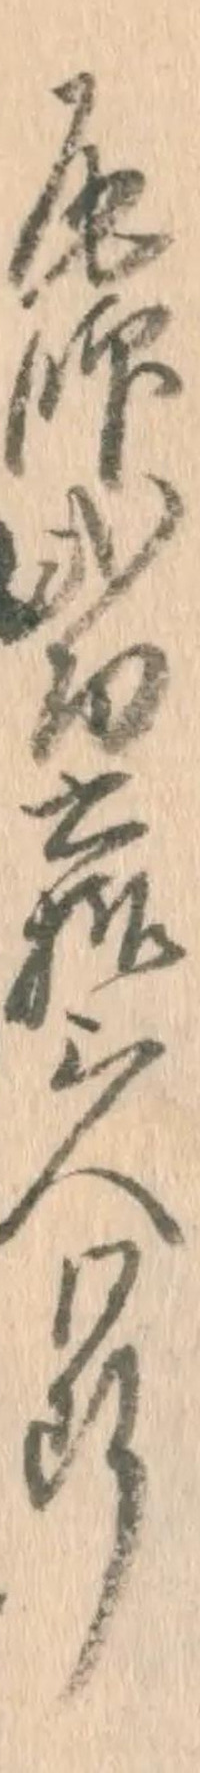瓦師弐百六拾三人同断

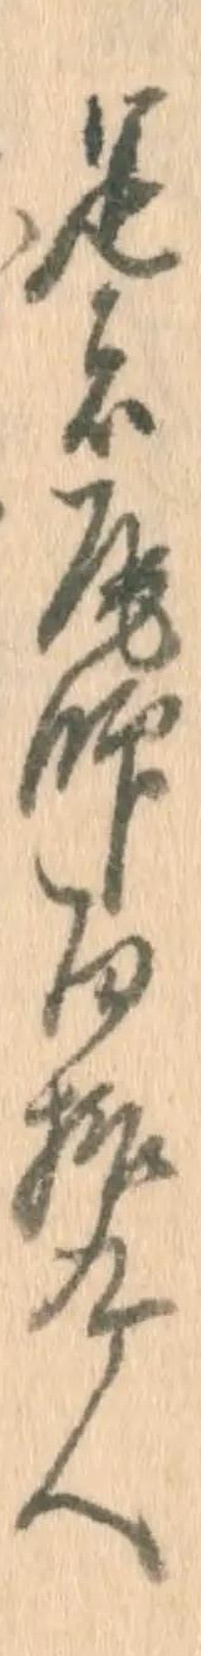是は瓦師百拾九人
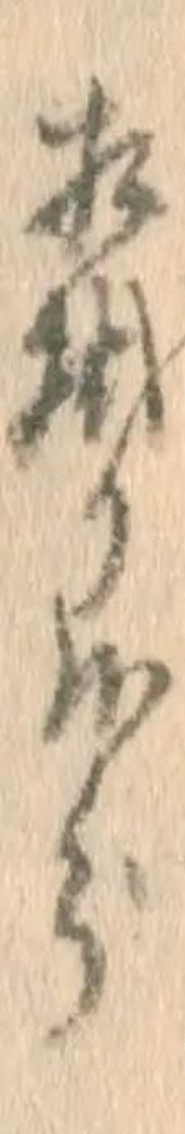相掛り候分
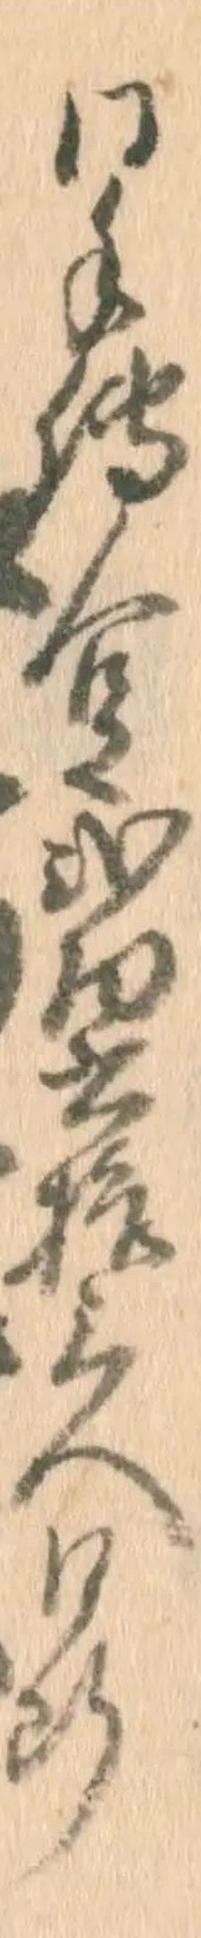同手伝人足弐百六拾三人同断
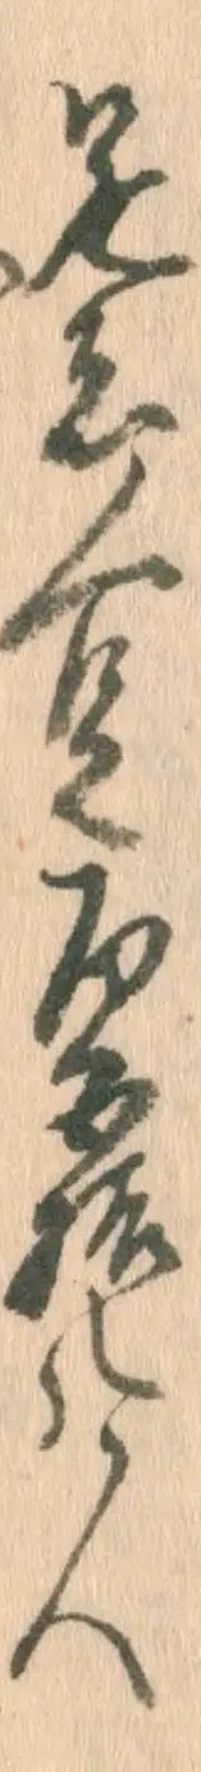是は人足百五拾八人
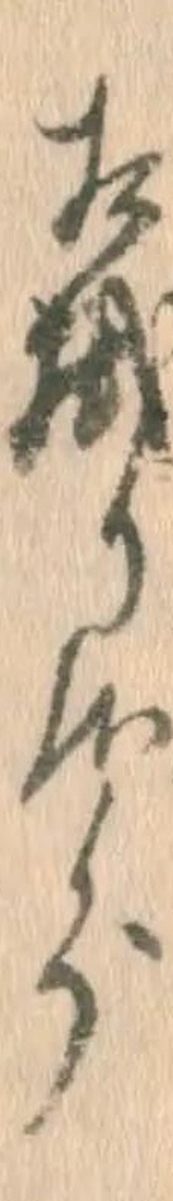相掛り候分
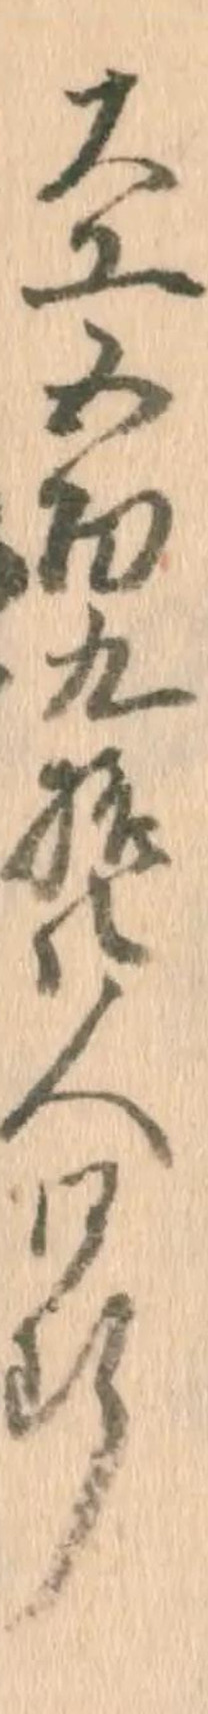大工五百九拾八人同断
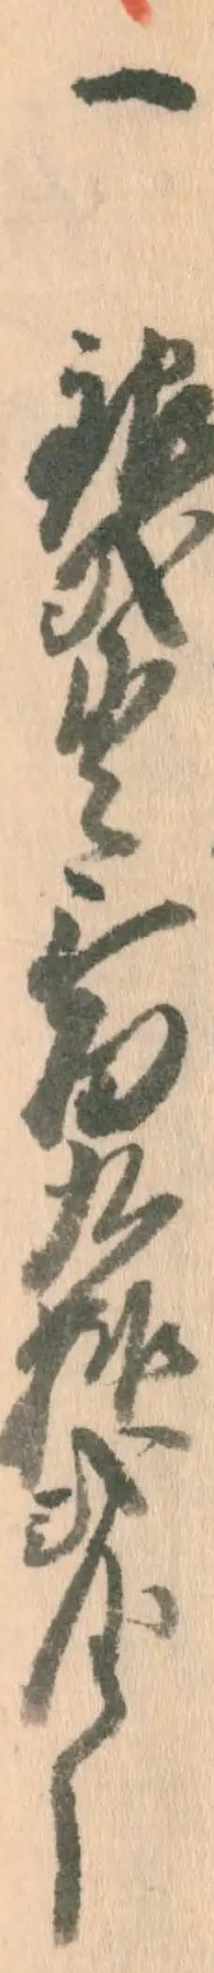一銀弐貫三百九拾弐匁
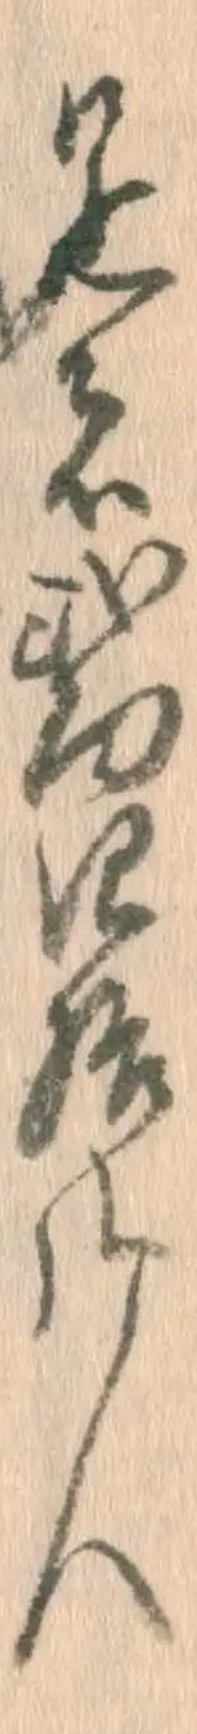是は弐百四拾八人
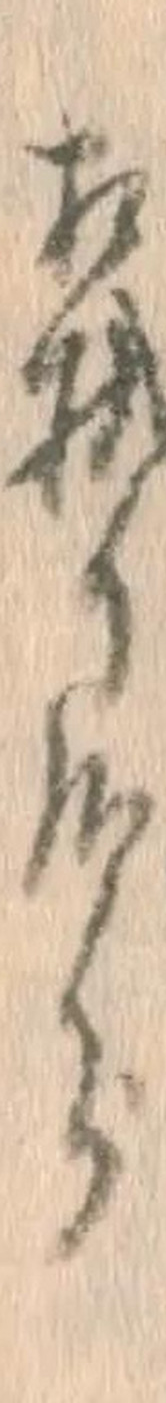相掛り候分
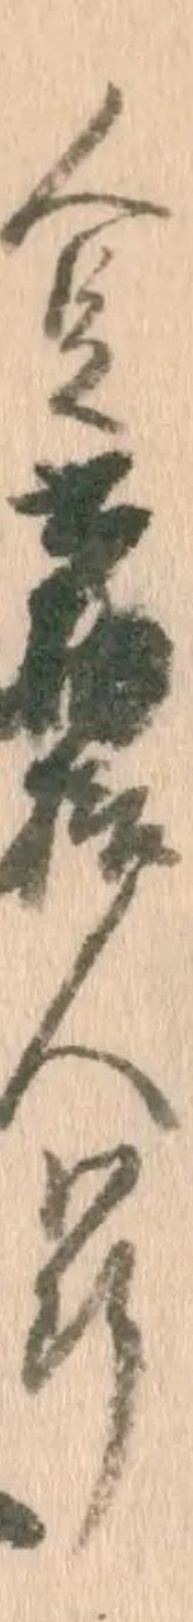人足六百拾人同断
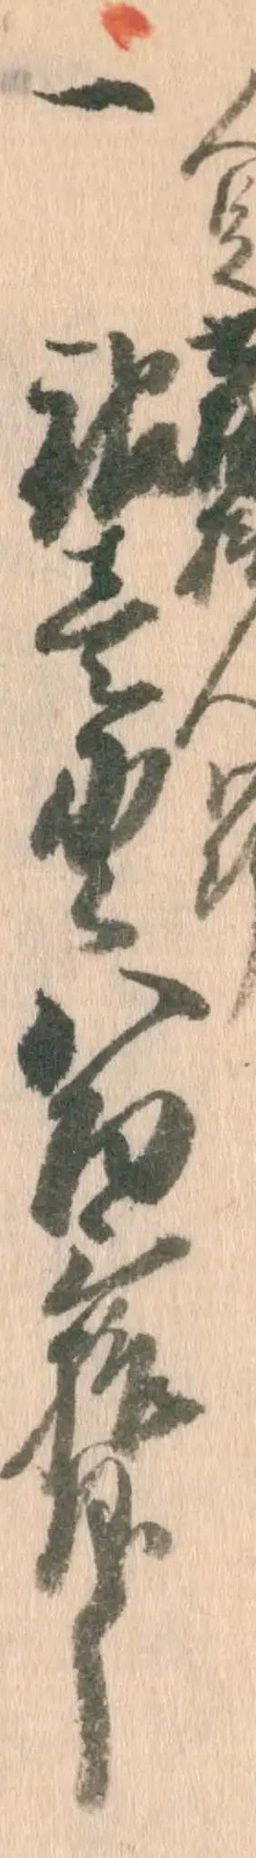一銀壱貫八百三拾匁
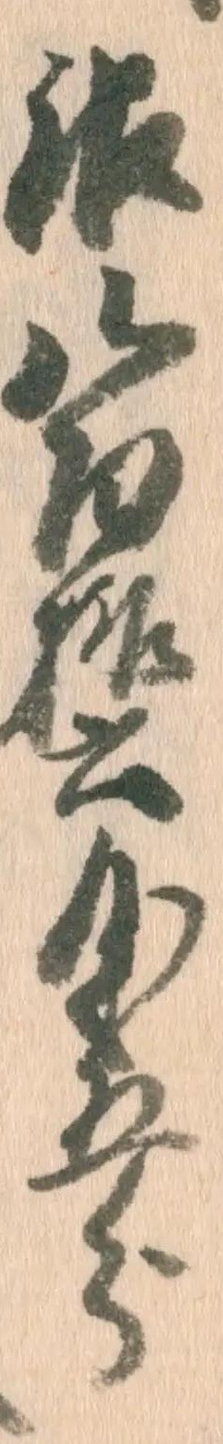銀八百拾六匁五分
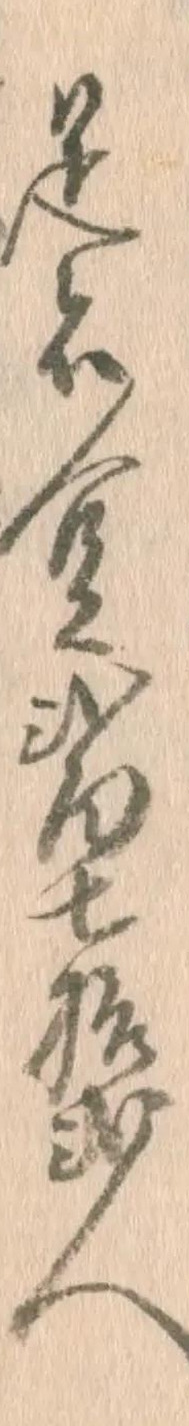是は人足弐百七拾弐人
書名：三十三間堂. [1]
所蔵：国立国会図書館 National Diet Library, JAPAN
